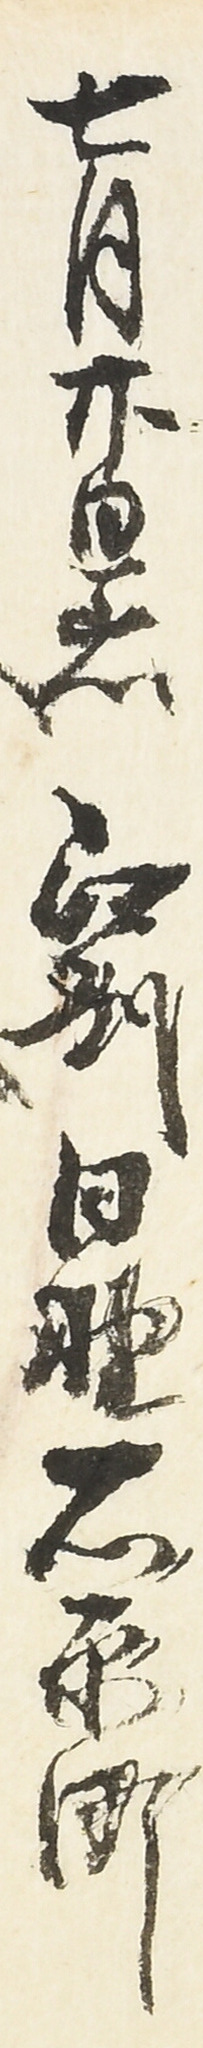七月廿日着江州日野石原町
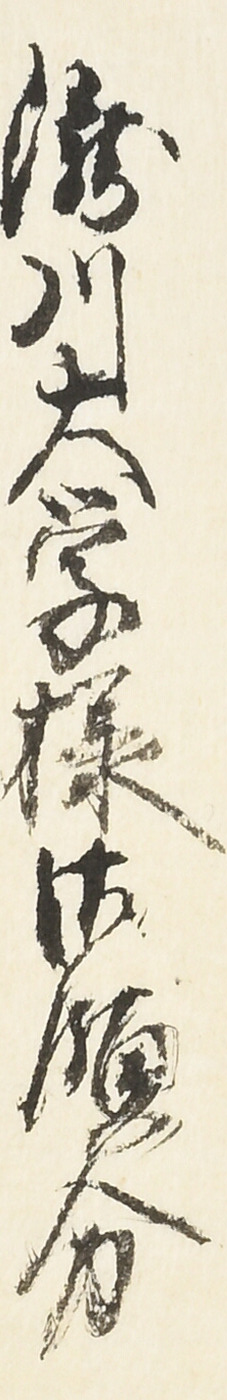瀧川大学様御城下
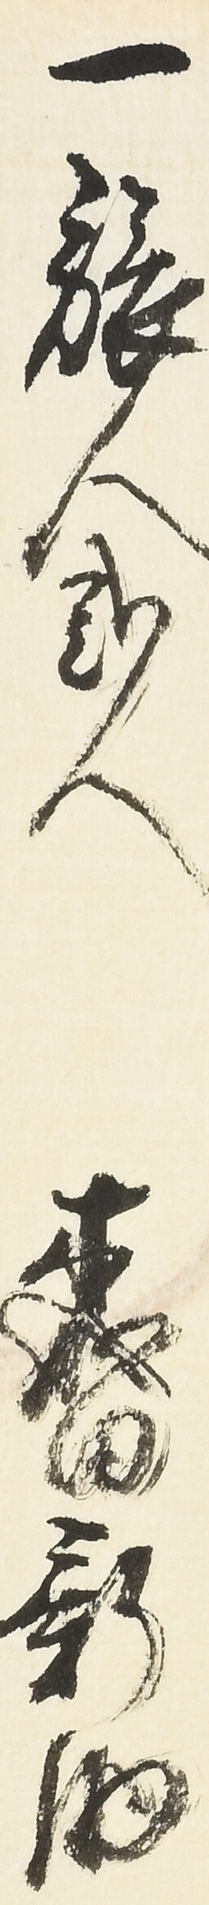一旅人弐人森田新助
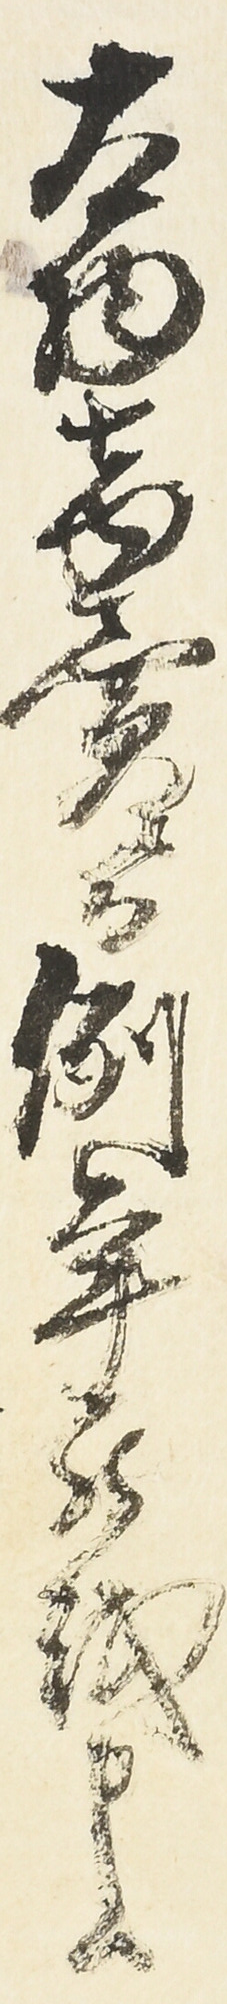太物商売ニ而例年罷越申候
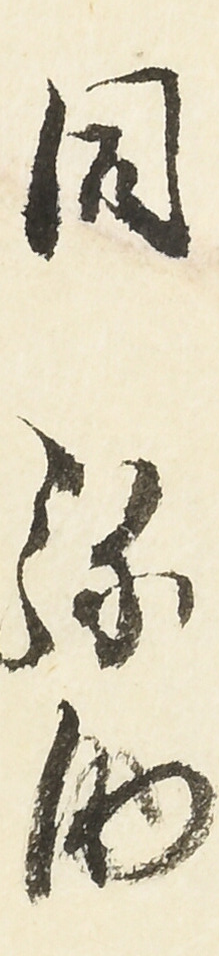同弥助
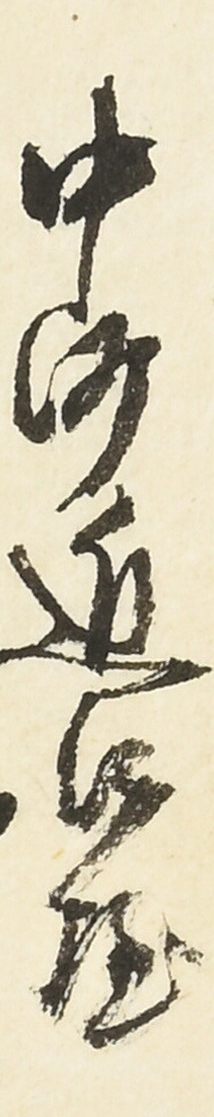中町近江屋
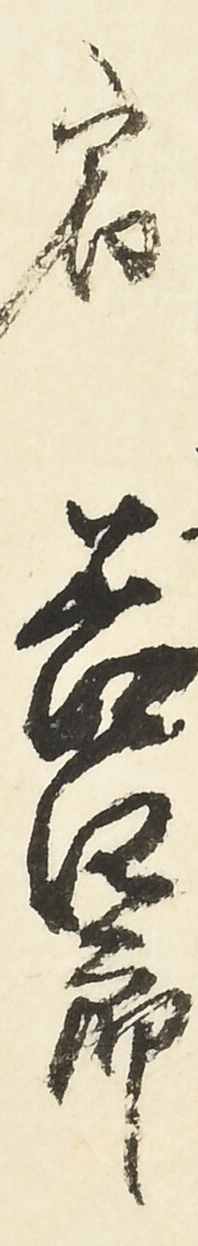宿善四郎
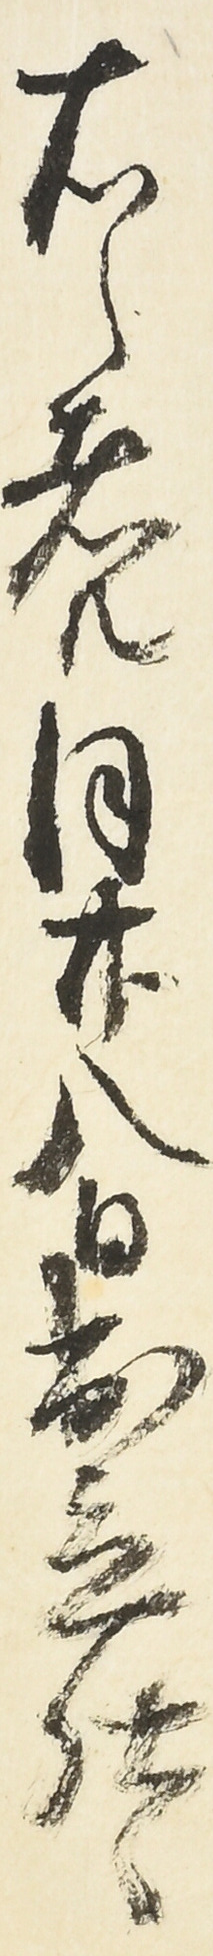右之者共同廿八日出立仕候
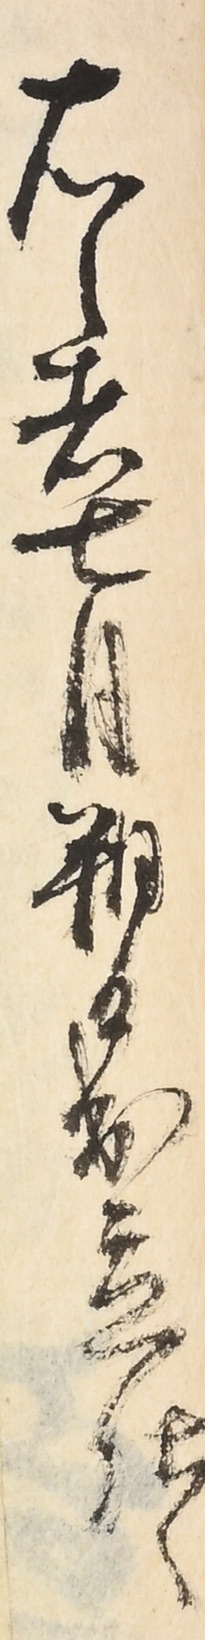右之者七月十二日出立仕候

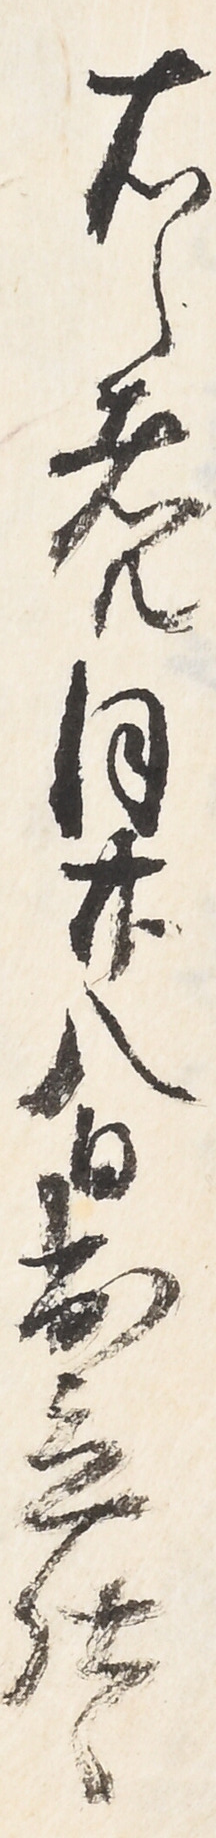右之者同廿八日出立仕候
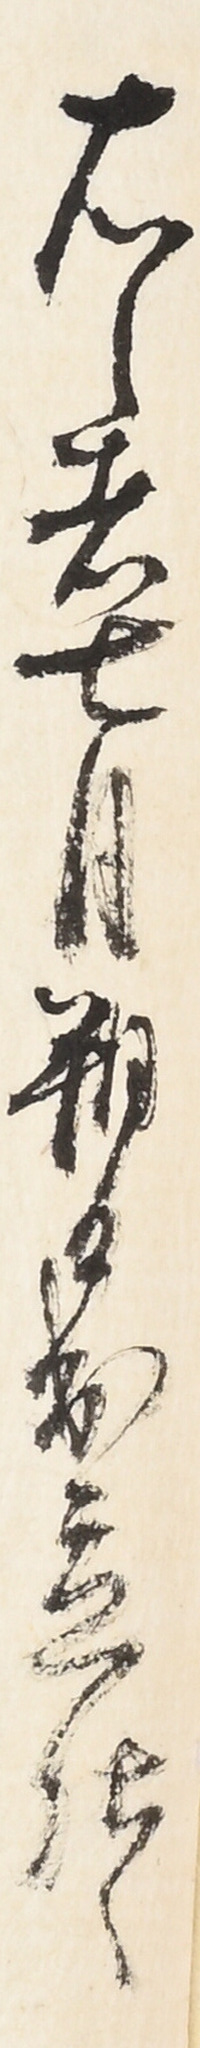右之者七月朔日出立仕候
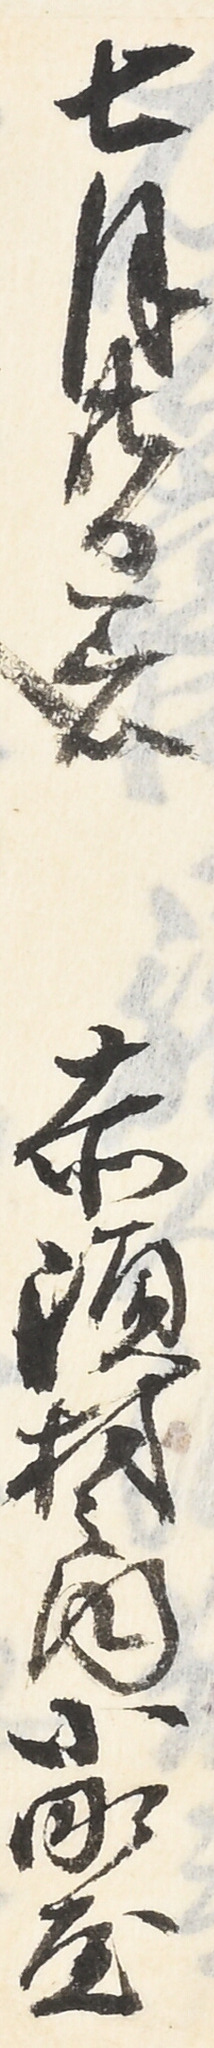七月廿日着赤瀬村之内小町屋
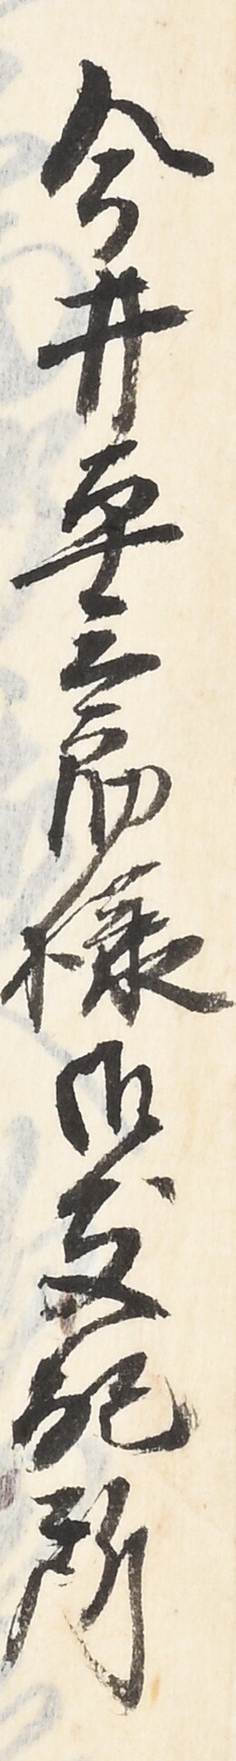今井平三郎様御支配所
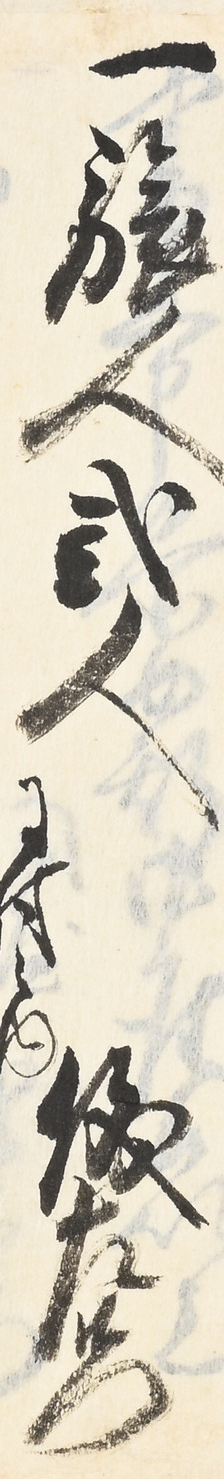一旅人弐人儀左衛門
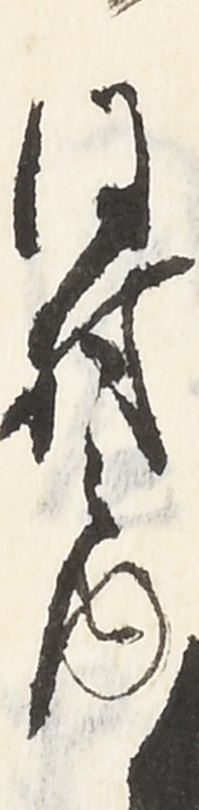同村之内
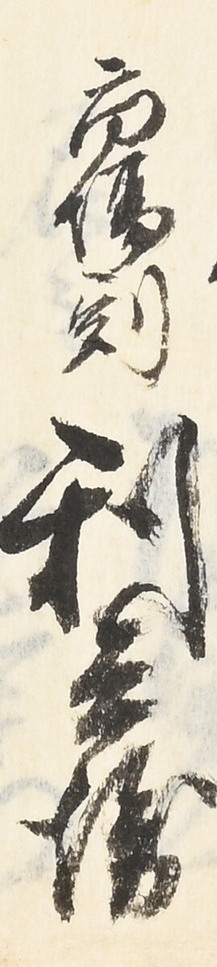市場割利兵衛
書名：町中旅人泊控帳
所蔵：伊那市立高遠町図書館・合同会社AMANE
